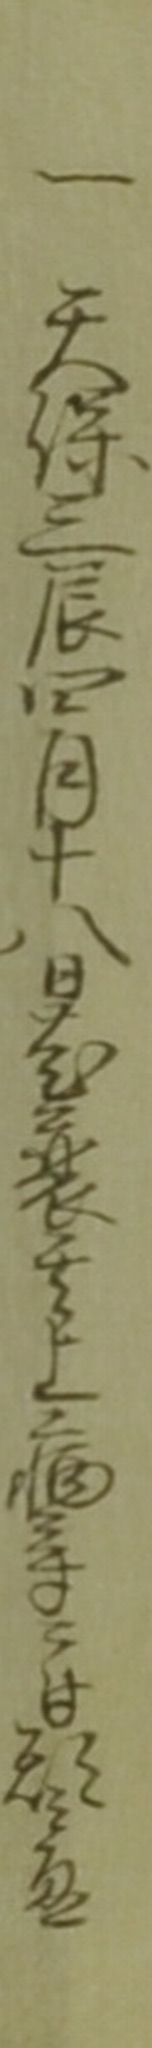一天保三辰四月十八日老衰其上病気ニ付願之通
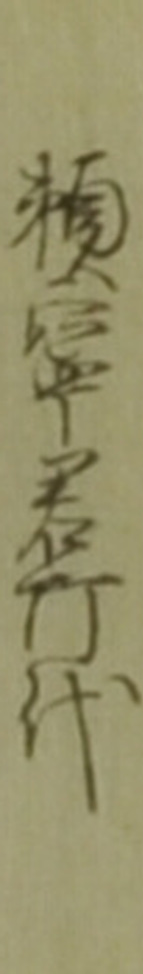頼寧君御代

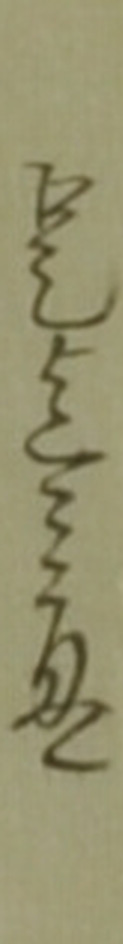是迄之通
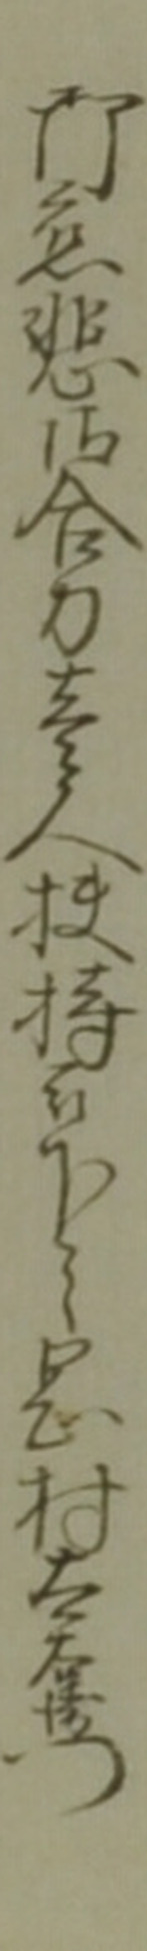御慈悲御合力壱人扶持被下之岡村太右衛門

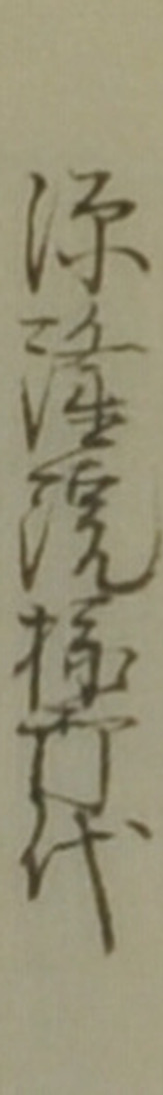源隆院様御代
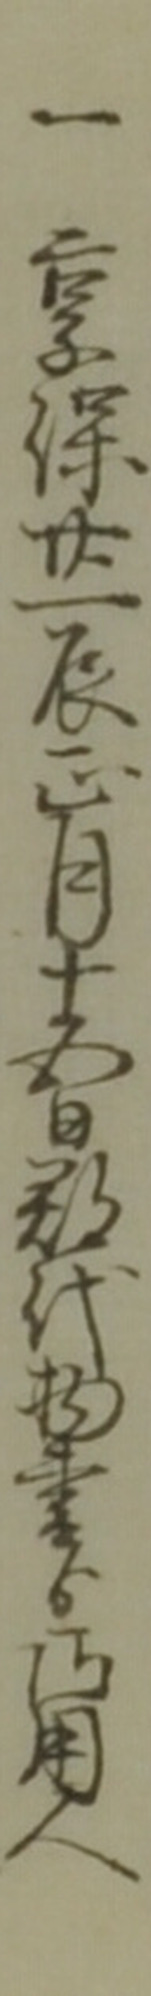一享保廿一辰正月十五日郡代物書ゟ御用人
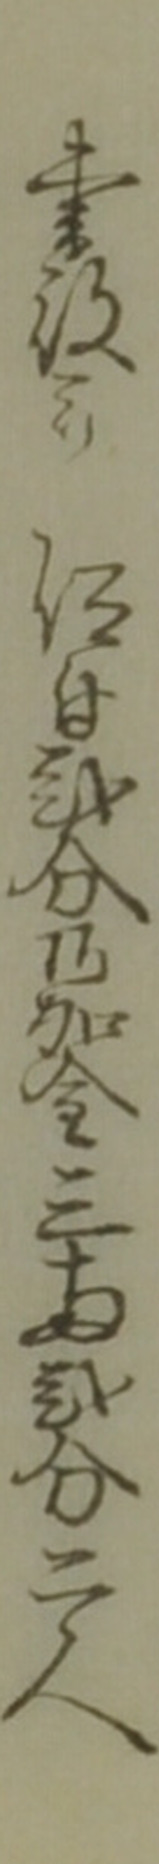書役被仰付弐分御加金三両弐分二人
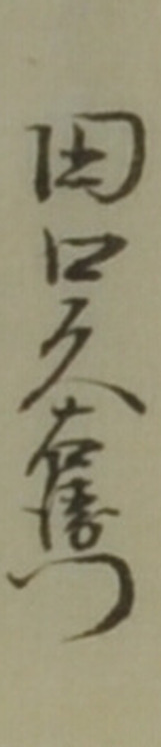田口久右衛門
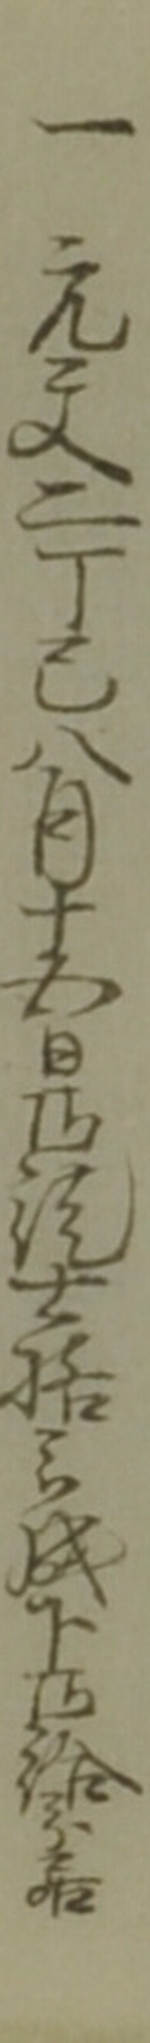一元文二丁巳八月十五日御徒士格被成下御給分居
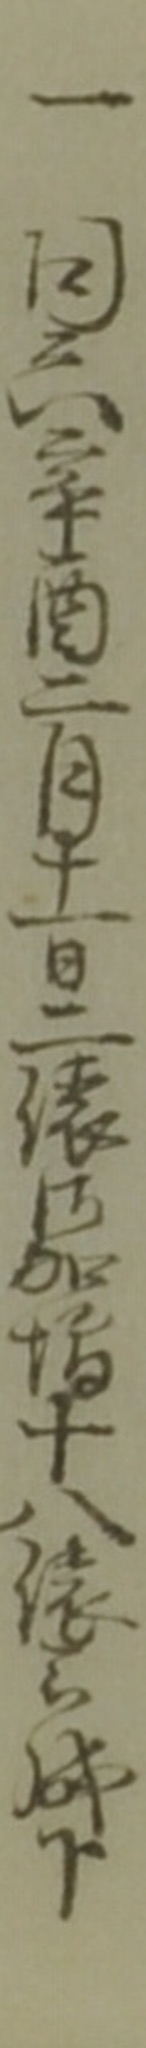一同六辛酉二月十一日二俵御加増十八俵被成下
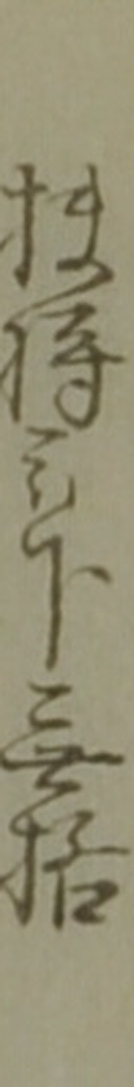扶持被下無格
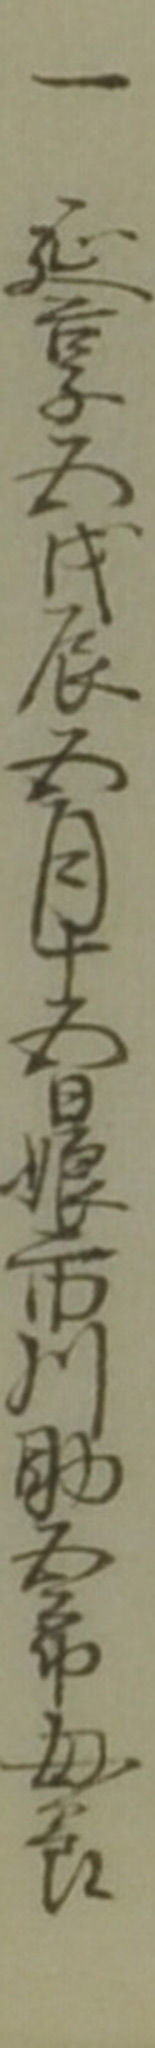一延享五戊辰五月十五日娘市川助五郎母養
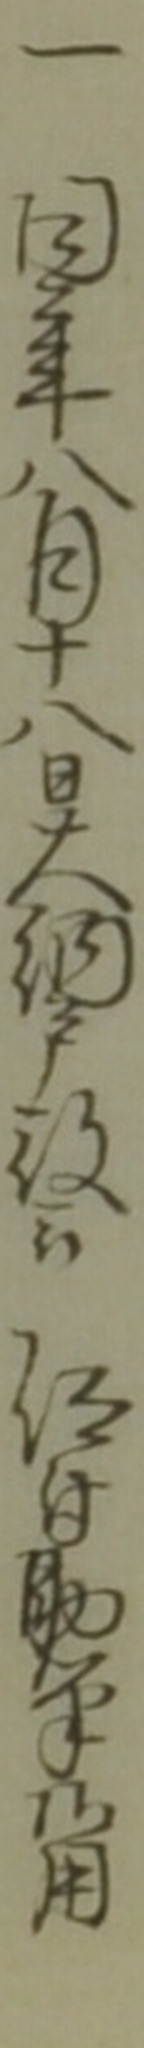一同年八月十八日大納戸役被仰付助筆御用
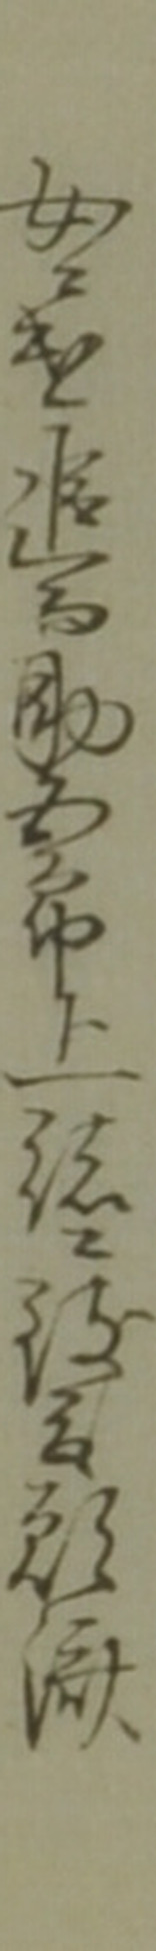女ニ遣追而助五郎ト一緒ニ致度願済
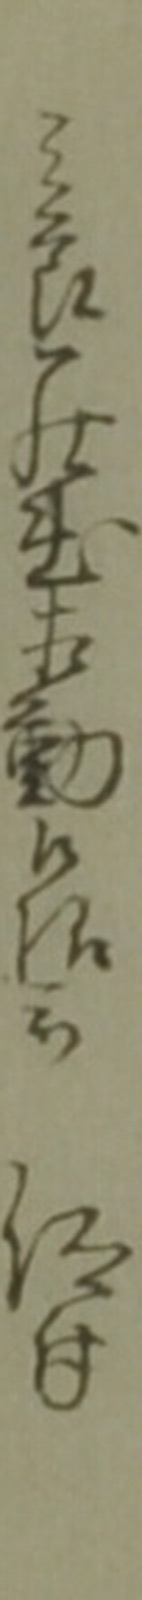之節罷出相勤候様被仰付
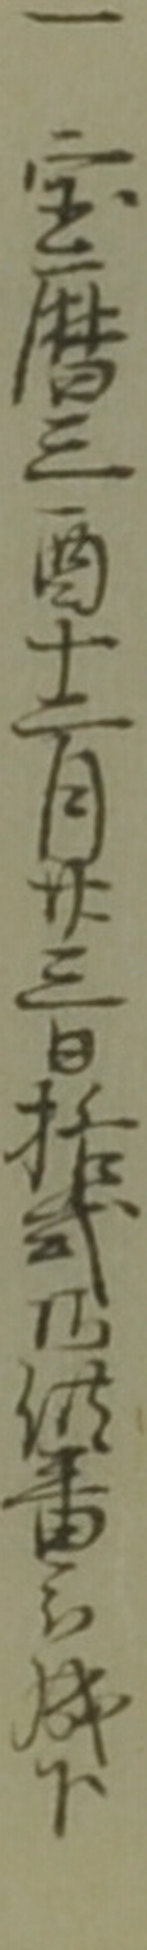一宝暦三酉十二月廿三日格式御供番被成下
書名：無足諸士勤仕録（九）
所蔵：伊那市立高遠町図書館・合同会社AMANE
